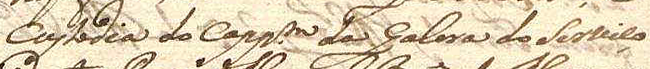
Custodia do Capp.m da Galera do serviço
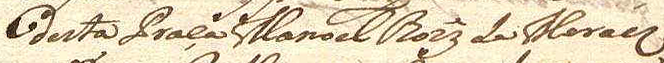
desta Praça Manoel Roiz̄ de Moraes
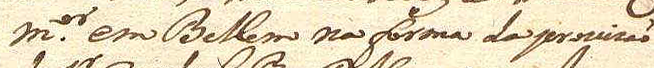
m.or em Bellem na forma da prouizaõ
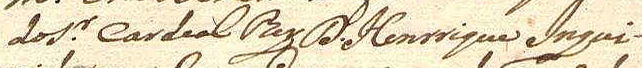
do s.r Cardeal Rey D. Henrrique Inqui
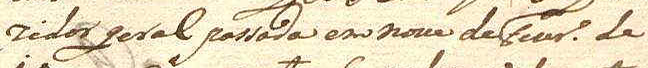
zidor geral passada em noue de Feur.o de
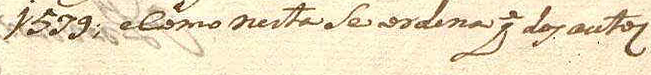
1579; e como nesta se ordena q̄ dos autos
